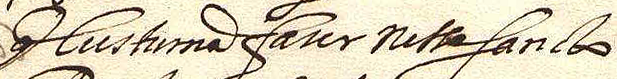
q̄ Custumaõ fazer nesse Sancto
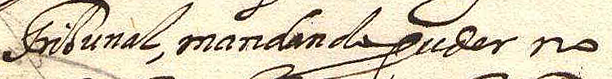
Tribunal, mandando ꝓceder no
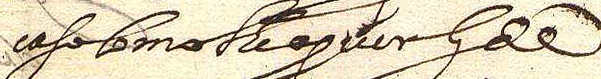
caso Como lhe aꝓuer G.de
